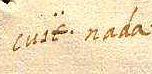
cust. nada
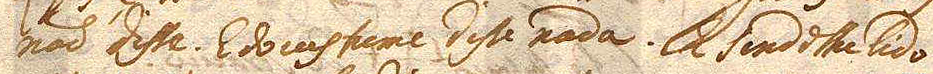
naõ disse. E do custume disse nada. E sendolhe lido
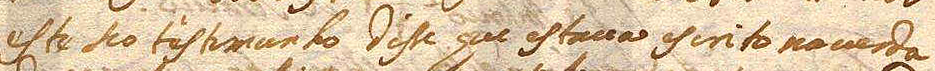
este seo testemunho disse que estaua escrito na uerda
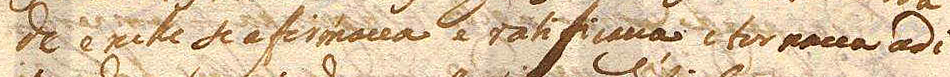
de e nelle se affirmaua e ratificaua, e tornaua a di
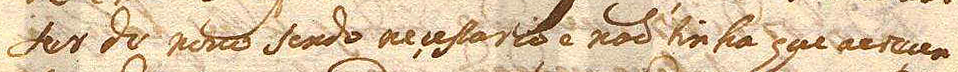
ser de nouo sendo necessario, e naõ tinha que acrecen
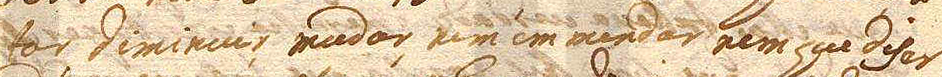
tar, diminuir, mudar, nem emmendar nem que diser
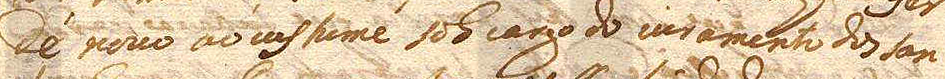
de nouo ao custume sob cargo do iuramento dos san
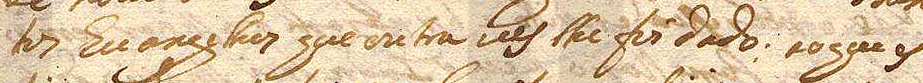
tos Euangelhos que outra ues lhe foi dado; ao que es
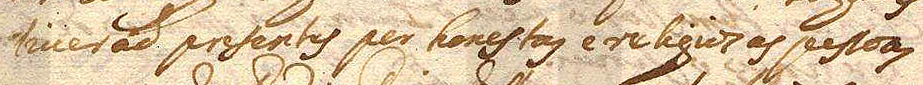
tiueraõ presentes por honestas e religiozas pessoas
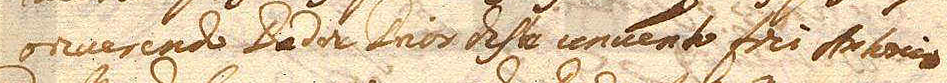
o reuerendo Padre Prior deste conuento frei Antonio
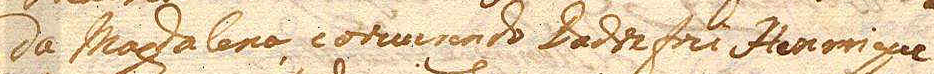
da Magdalena, e o reuerendo Padre frei Henrrique
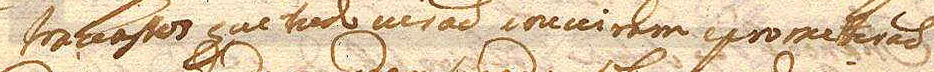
trauassos que tudo uirão e ouuiram e prometteraõ
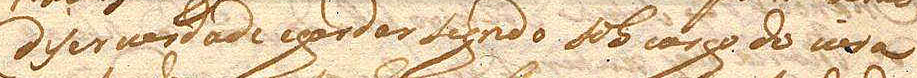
diser uerdade gardar segredo sob cargo do iura
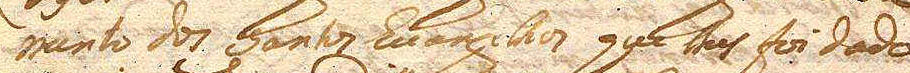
mento dos Santos Euangelhos que lhes foi dado
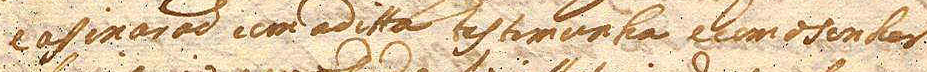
e assinaraõ com a ditta testemunha e com o senhor
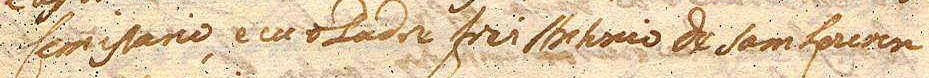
Comissario, e eu o Padre frei Antonio de sam Louren
